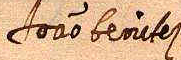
Ioaõ benitez
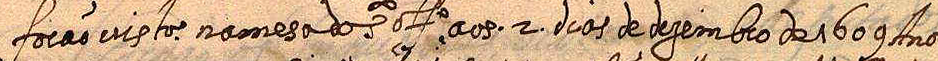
foraõ uistos. na mesa do sto offo. aos. 2. dias de dezembro de 1609 Anos.
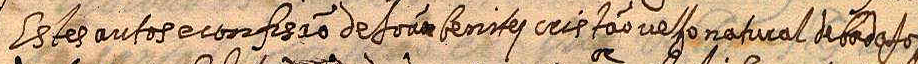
Estes autos e confisaõ de Ioaõ benitez cristaõ uelho natural de badaJoz
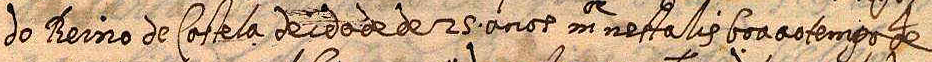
do Reino de Castela de idade de 25. anos mor nesta lisboa ao tempo de
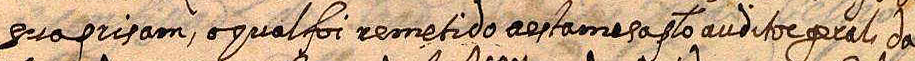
sua prisam, o qual foi remetido a esta mesa pl̄o auditor geral da
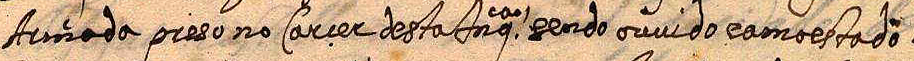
Armada preso no Carcer desta Inqcaõ. sendo ouuido e amoestado
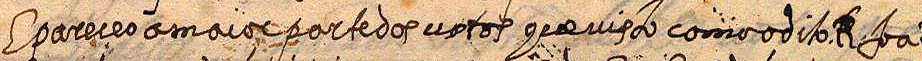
E pareceo a maior parte dos uotos que uisto como o dito .R. Joaõ
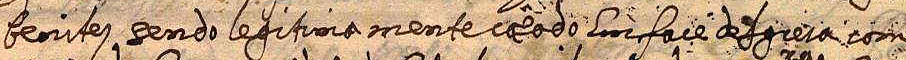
benitez sendo legitimamente casado Em face da Igreia com
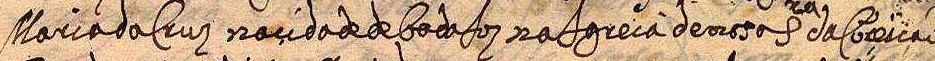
Maria da Cruz na cidade de badajoz na Igreia de nosa Sra da Cōceiçaõ
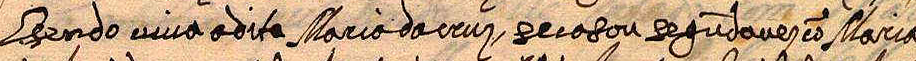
E sendo uiua a dita Maria da cruz, se casou segūda uez cō Maria
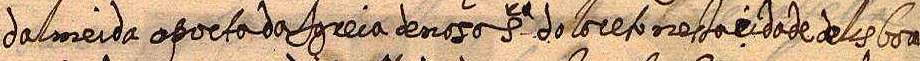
dalmeida a porta da Igreia de nosa s.ra do loreto cidade de lisboa
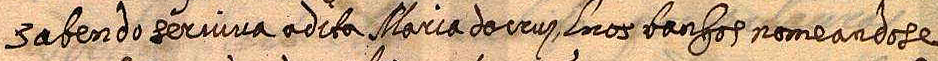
sabendo ser uiua a dita Maria da cruz, E nos banhos nomeandose
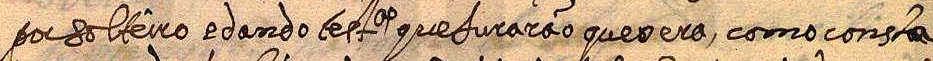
por solteiro e dando test.as que Iuraraõ que o era, como consta
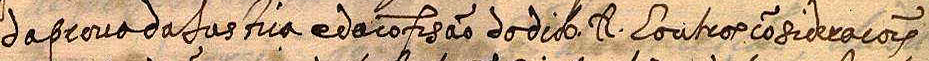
da proua da Iustiça e da cōfisaõ do dito .R. E outras cōsideraçoĩs
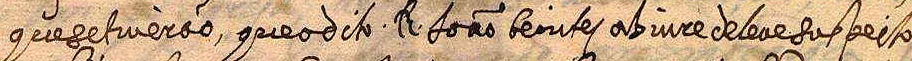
que se tiueraõ, que o dito .R. Ioaõ benitez abiure de leue sospeito
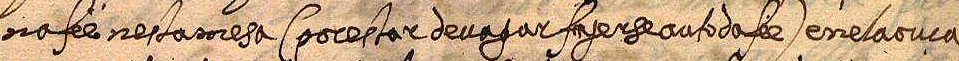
na fee nesta mesa (por estar deuagar fazerse auto da fee) e nela ouça
